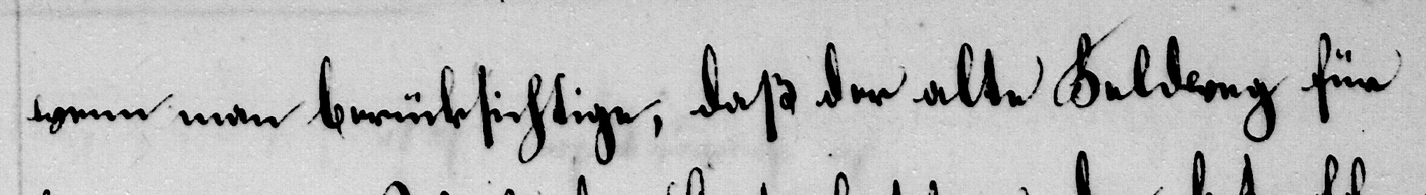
wenn man berücksichtige, daß der alte Feldweg für
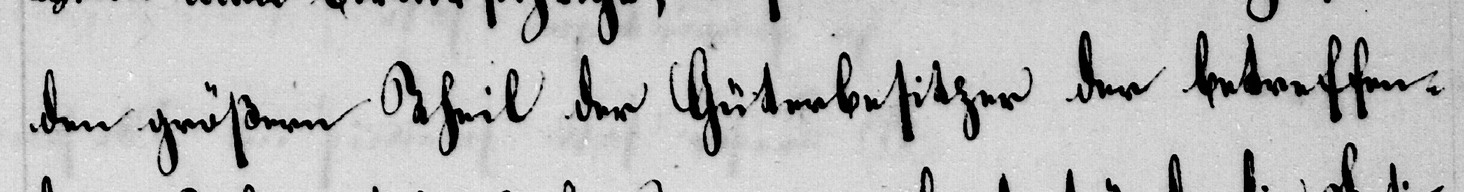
den größern Theil der Güterbesitzer der betreffen¬
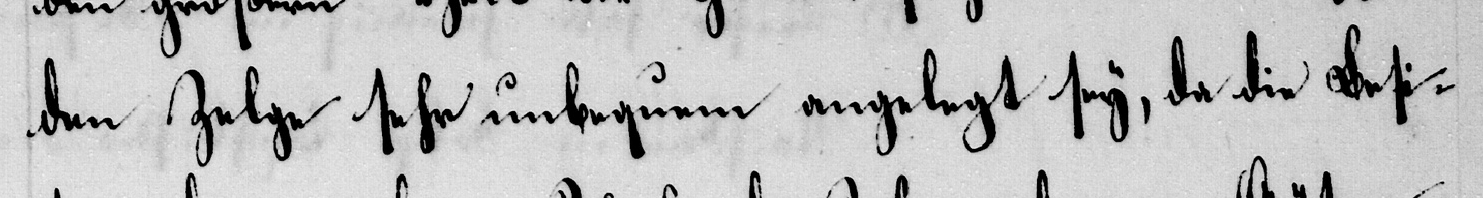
den Zelge sehr unbequem angelegt sey, da die Besi¬
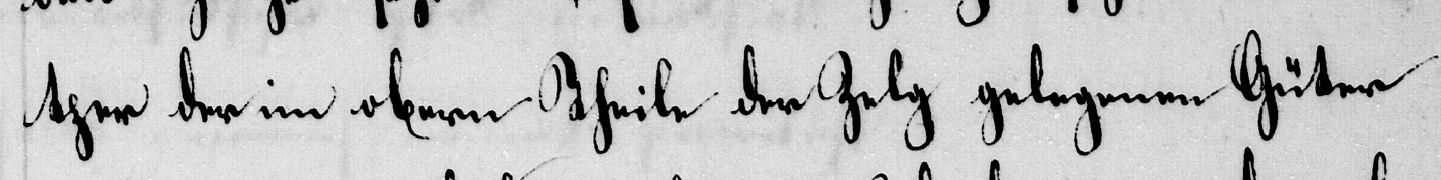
tzer der im obern Theile der Zelg gelegenen Güter
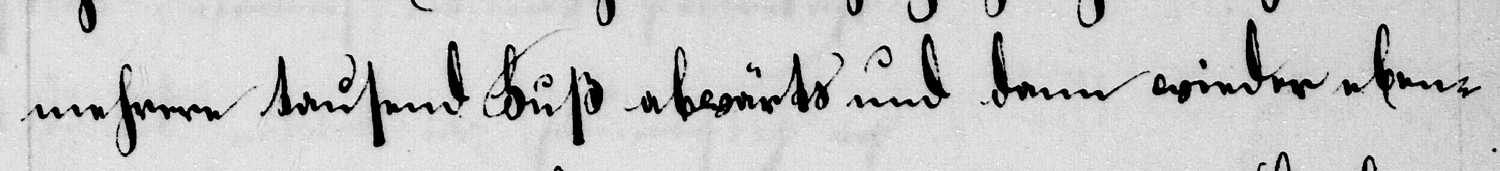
mehrere tausend Fuß abwärts und dann wieder eben¬
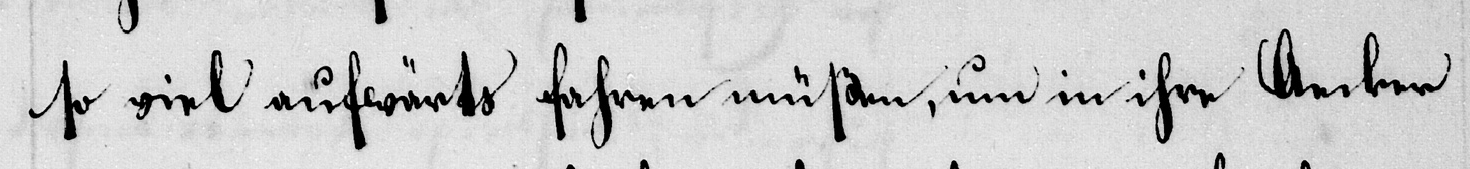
so viel aufwärts fahren müßen, um in ihre Acker
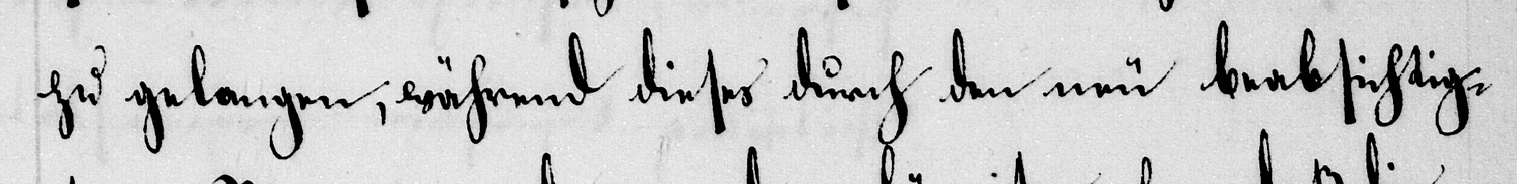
zu gelangen, während dieses durch den neu beabsichtig¬
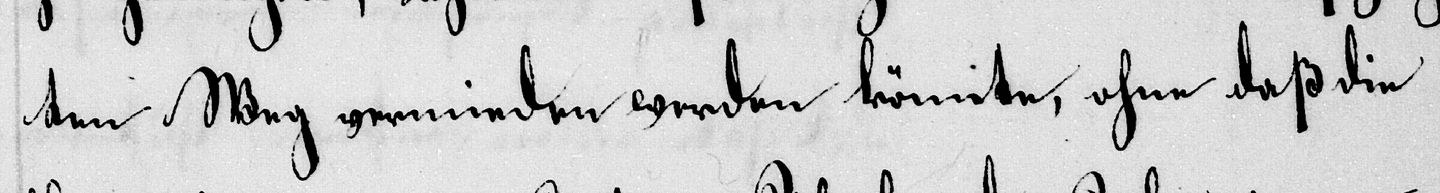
ten Weg vermieden werden könnte, ohne daß die
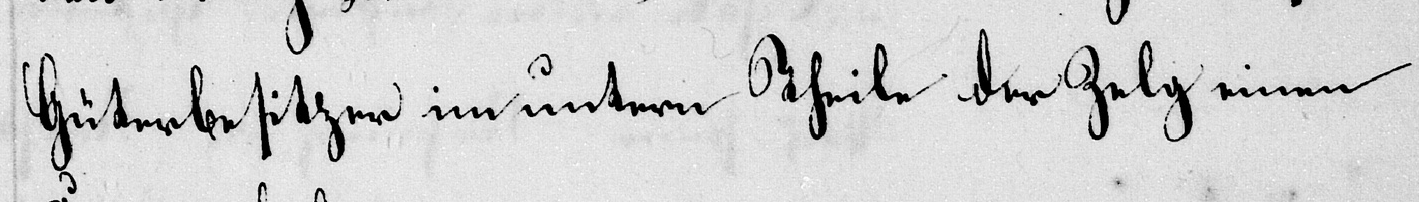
Güterbesitzer im untern Theile der Zelg einen
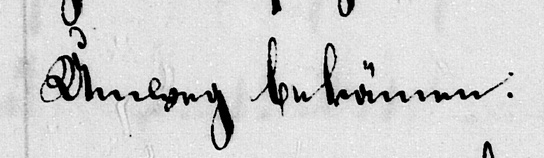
Umweg bekämen:
